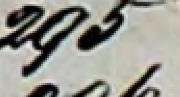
295
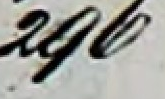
296
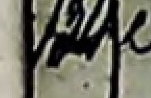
134
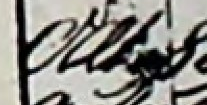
Alt
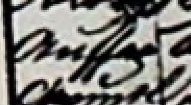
Aussee
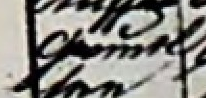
Grund
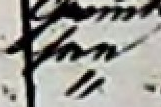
see
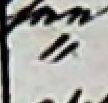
„
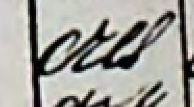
Alt
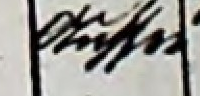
Aussee
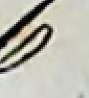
6
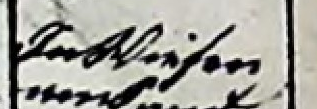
In Wiesen
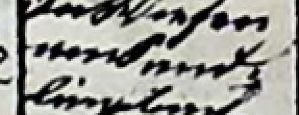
ums und
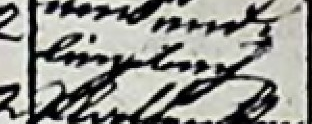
???
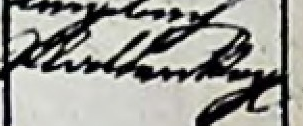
Plattenkogl
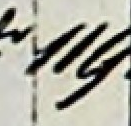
119
